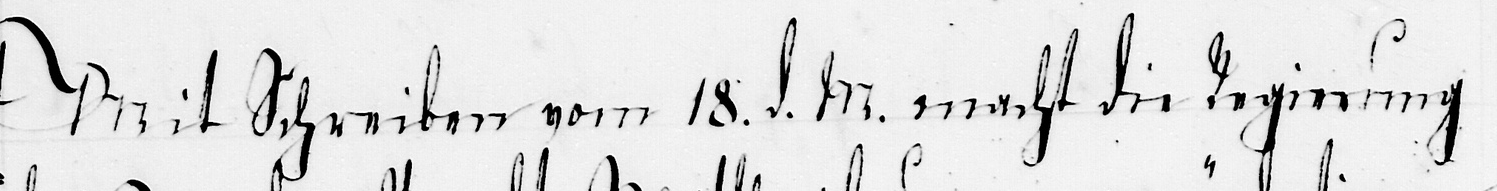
Mit Schreiben vom 18. d. M. macht die Regierung
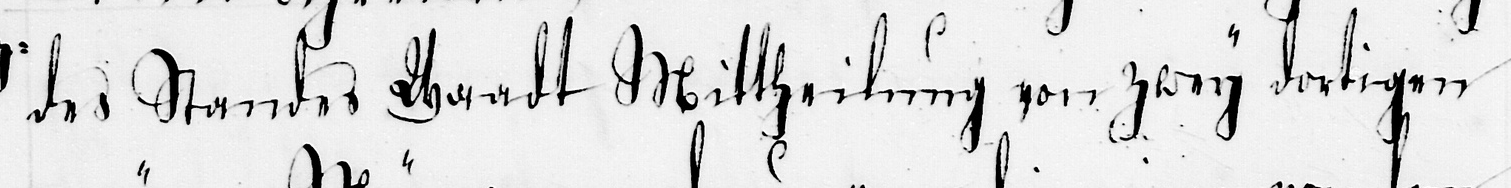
des Standes Waadt Mittheilung von zwey dortigen
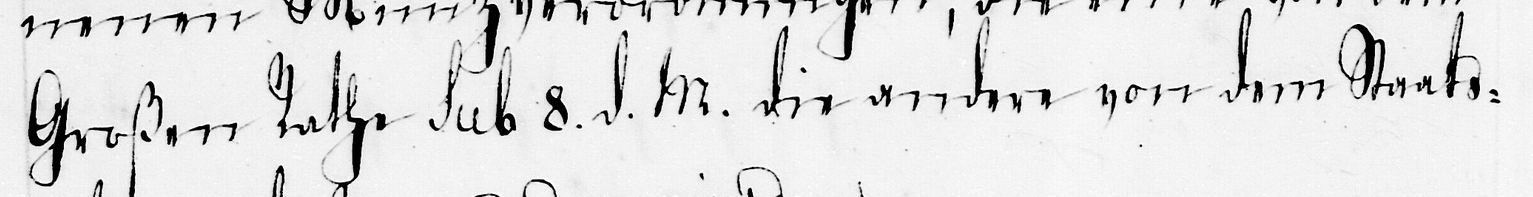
Großen Rathe sub 8. d. M. die andere von dem Staats¬
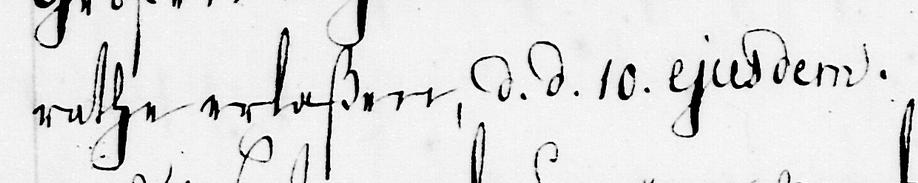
rathe erlaßen, d. d. 10. ejusdem.
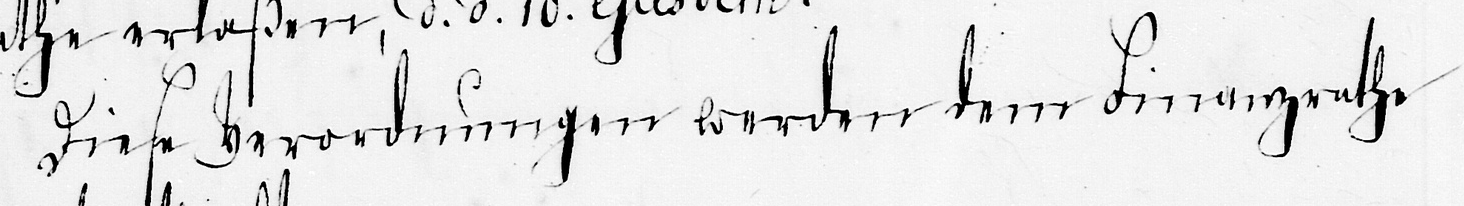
Diese Verordnungen werden dem Finanzrathe
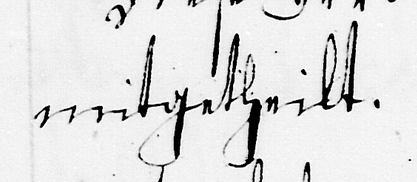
mitgetheilt.
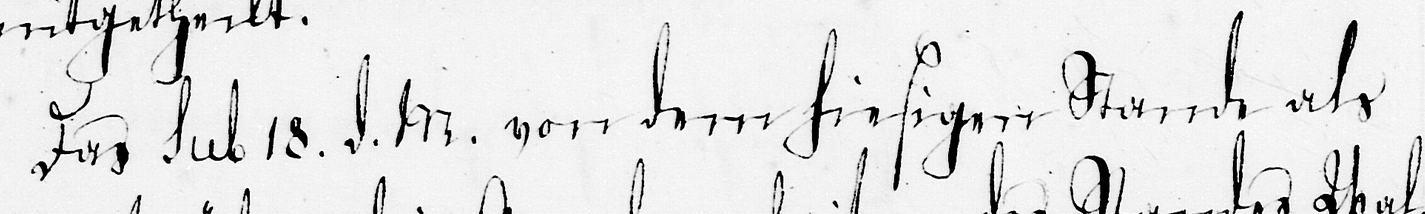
Das sub 18. d. M. von dem hiesigen Stande als
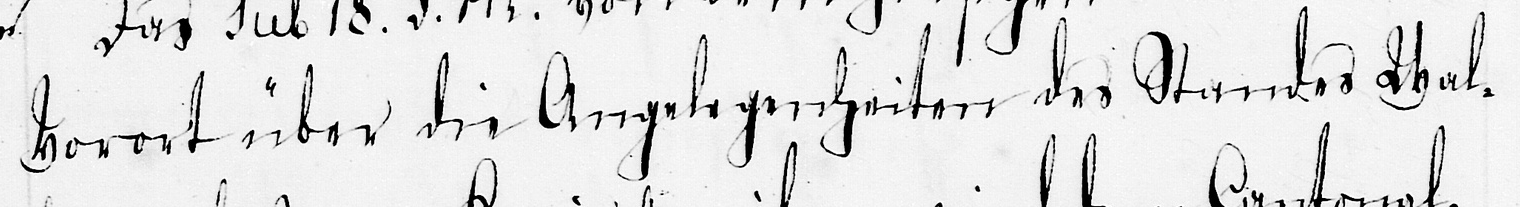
Vorort über die Angelegenheiten des Standes Wal¬
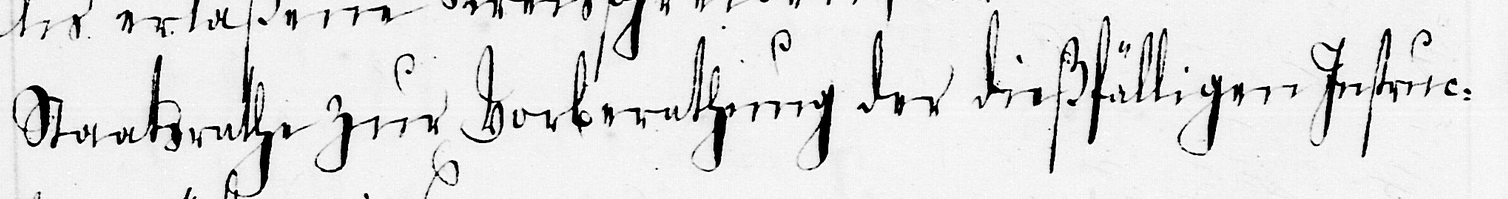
taatsrathe zur Vorberathung der dießfälligen Instruc¬
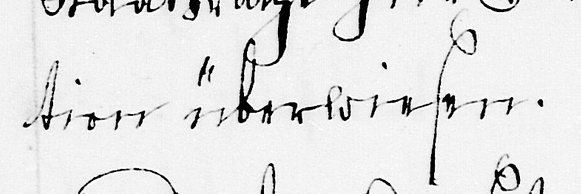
tion überwiesen.
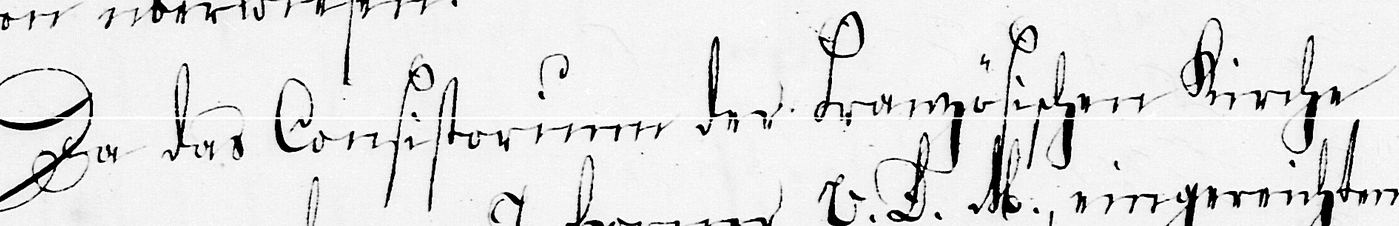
Da das Consistorium der Französischen Kirche
